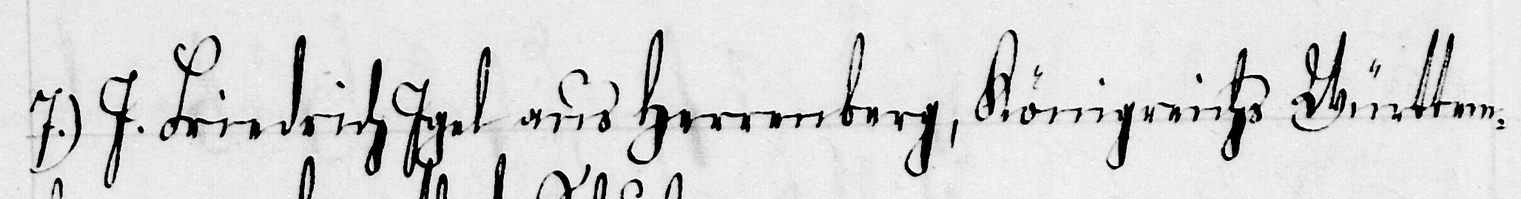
7.) J. Friedrich Igel aus Herrenberg, Königreichs Württem¬
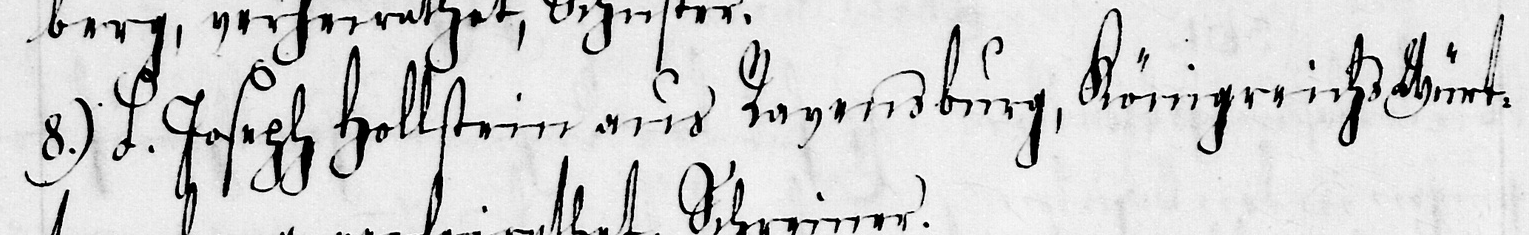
8.) F. Joseph Hollstein aus Ravensburg, Königreichs Würt¬
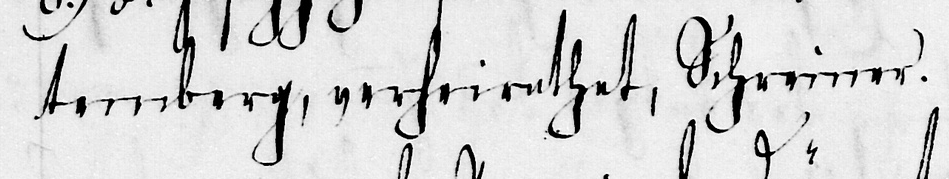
temberg, verheirathet, Schreiner.
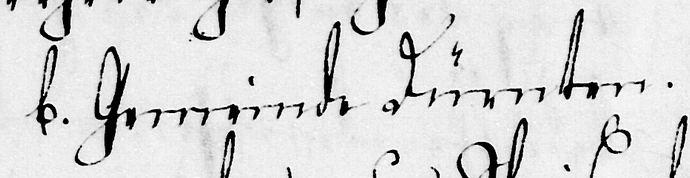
b. Gemeinde Dürnten.
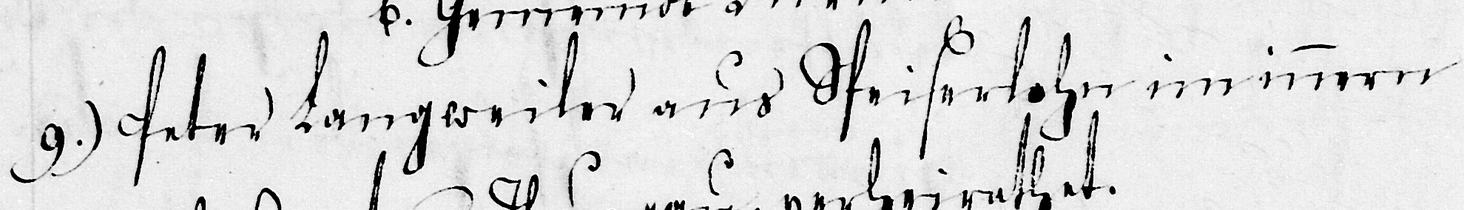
9.) Peter Langweiler aus Speiserlohn im innern
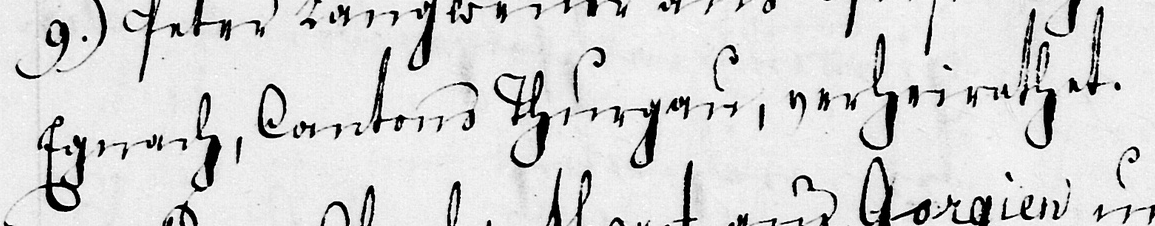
Egnach, Cantons Thurgau, verheirathet.
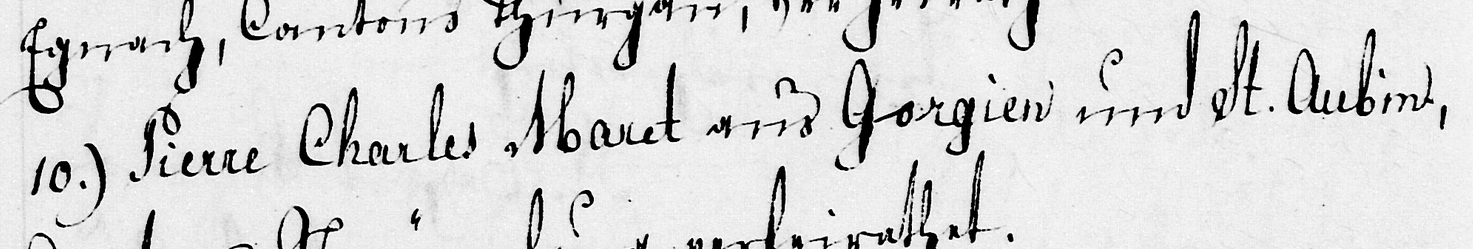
10.) Pierre Charles Maret aus Gorgien und St. Aubin,
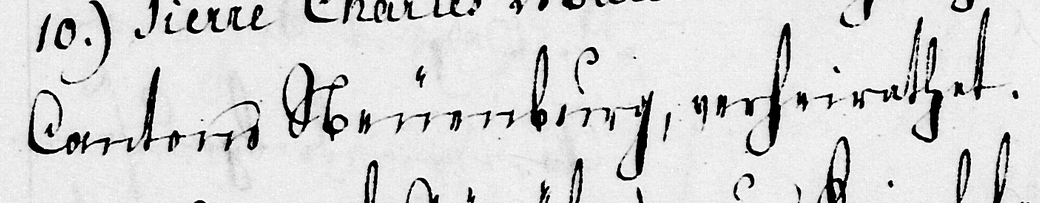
Cantons Neuenburg, verheirathet.
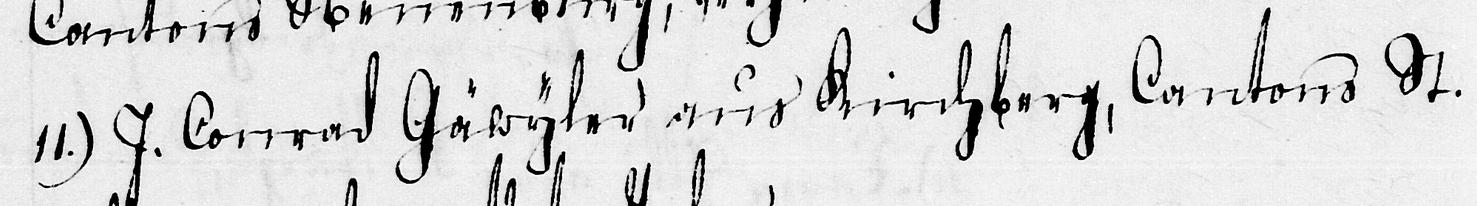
11.) J. Conrad Gäwyler aus Kirchberg, Cantons St.
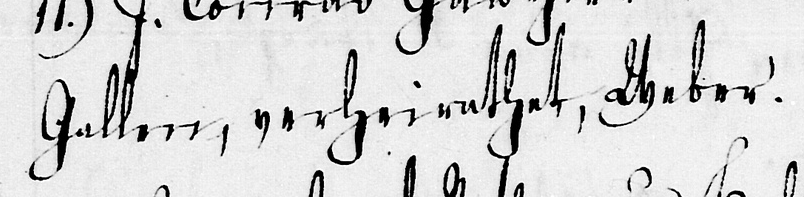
Gallen, verheirathet, Weber.
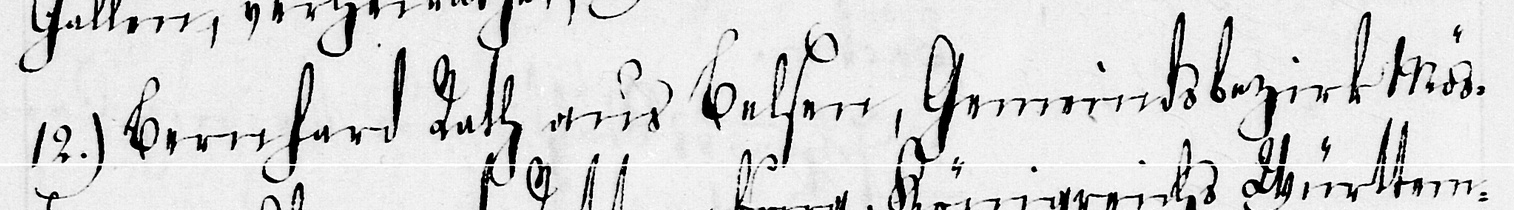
12.) Bernhard Rath aus Belsen, Gemeindsbezirk Möß¬
